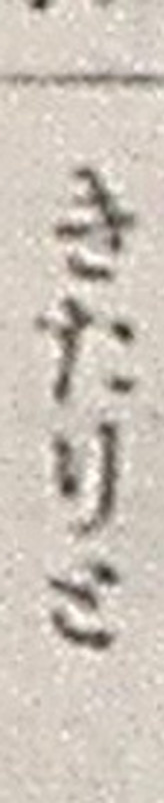きたりと
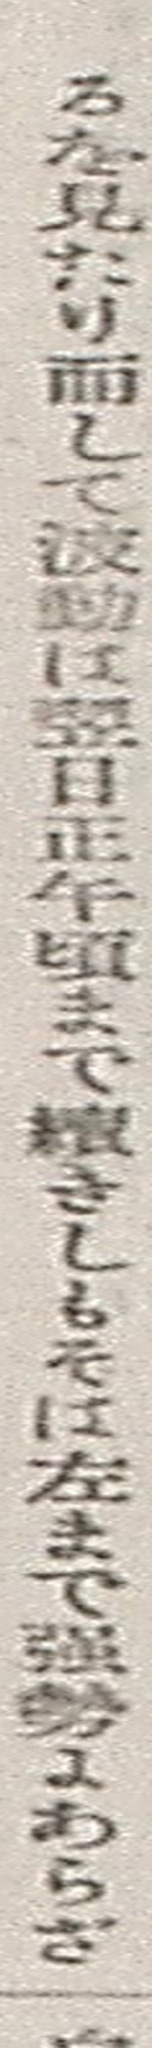るを見たり而して波動は翌日正午頃まで続きしもそは左まで強勢にあらざ
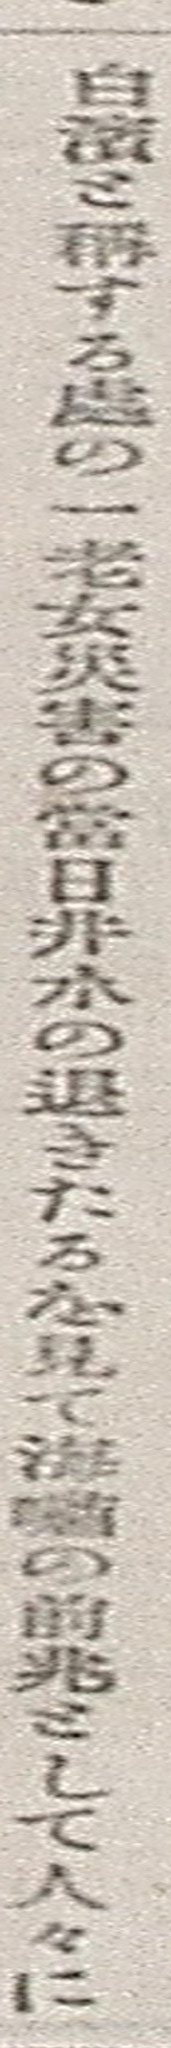白浜と称する処の一老女災害の当日井水の退きたるを見て海嘯の前兆として人々に
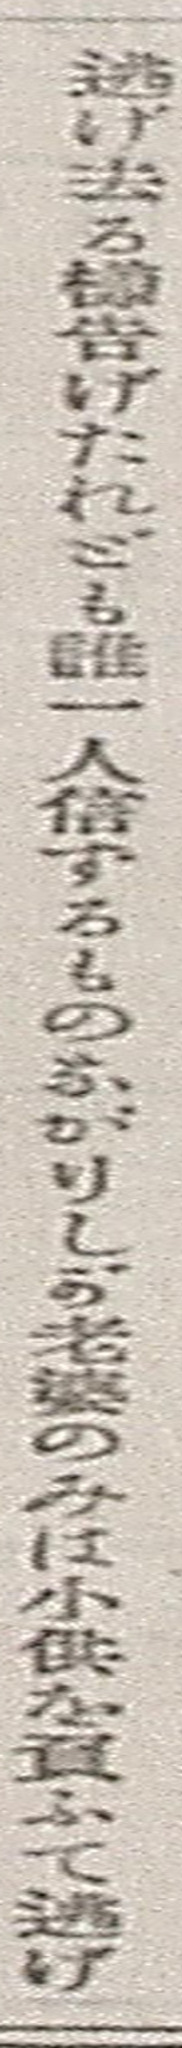逃げ去る様告げたれども誰一人信ずるものなかりしが老婆のみは小供を負ふて逃げ
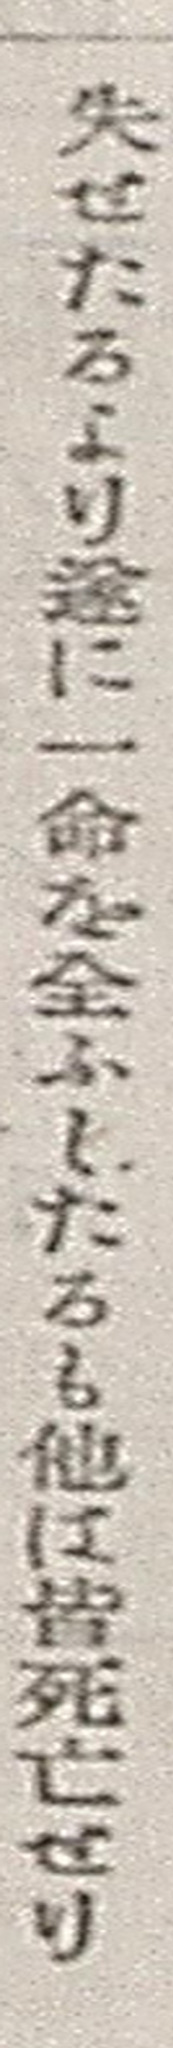失せたるより遂に一命を全ふしたるも他は皆死亡せり
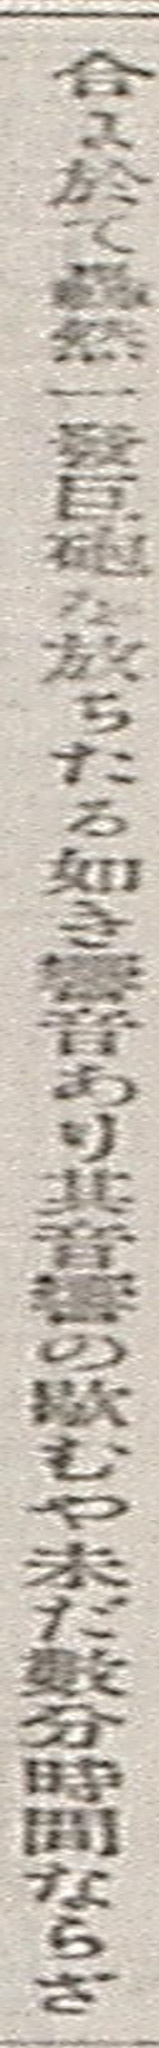合に於て轟然一発巨砲を放ちたる如き響音あり其音響の歇むや未だ数分時間ならざ
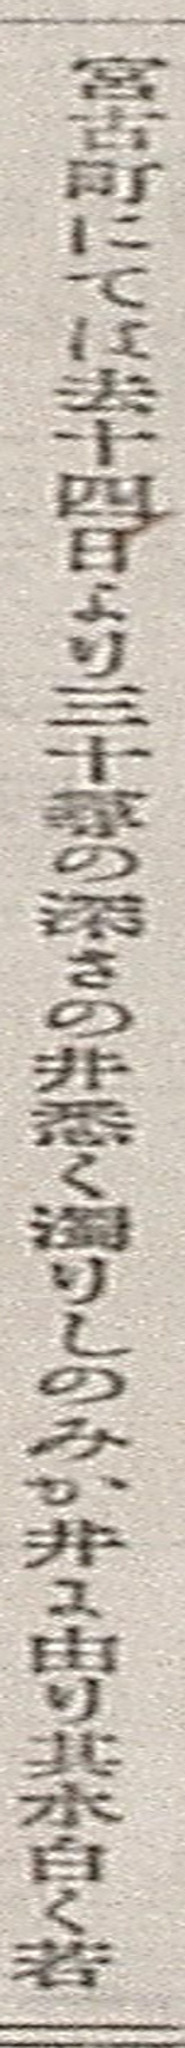宮古町にては去十四日より三十尋の深さの井悉く濁りしのみか井に由り其水白く若
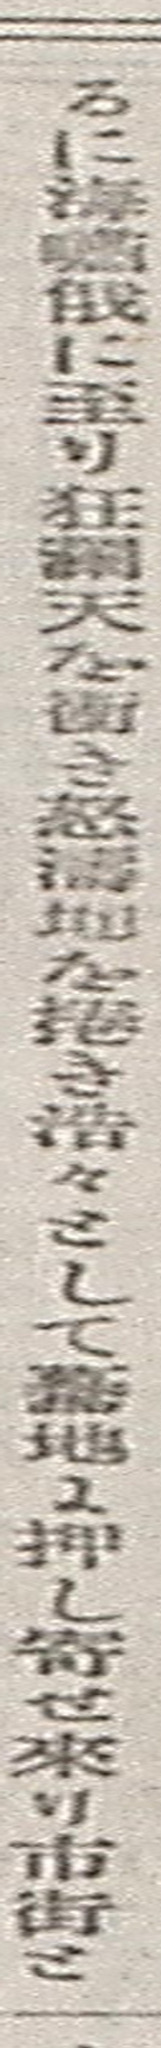るに海嘯俄に至り狂瀾天を衝き怒濤地を捲き浩々として驀地に押し寄せ来り市街と
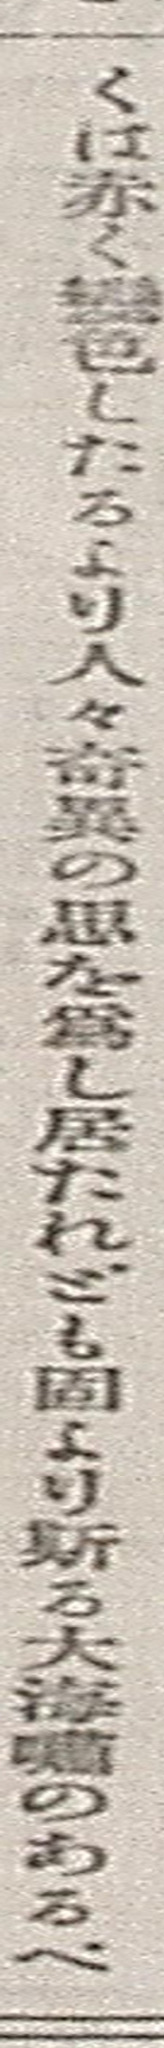くは赤く変色したるより人々奇異の思を為し居たれども固より斯る大海嘯のあるべ
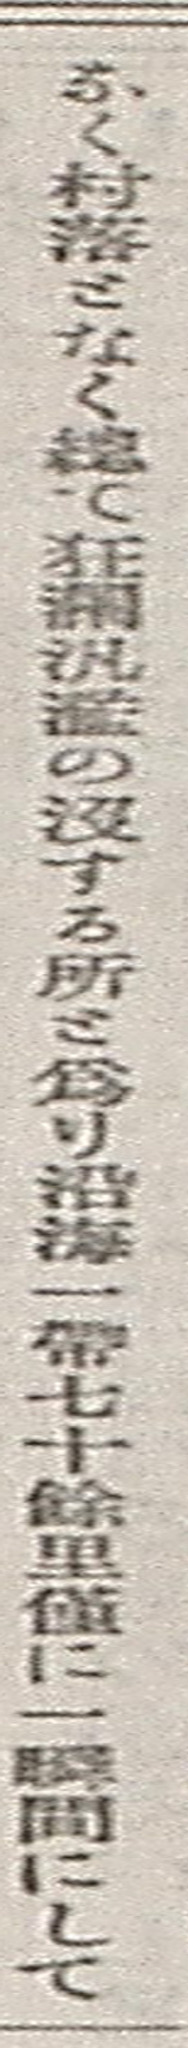なく村落となく総て狂瀾汎濫の没する所と為り沿海一帯七十余里僅に一瞬間にして
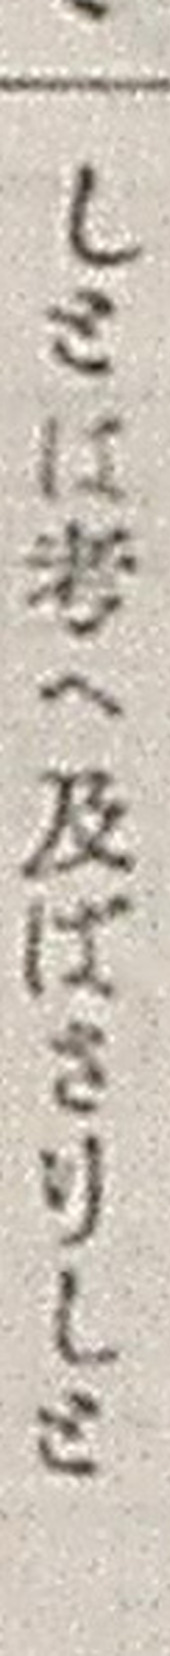しとは考へ及ばざりしと
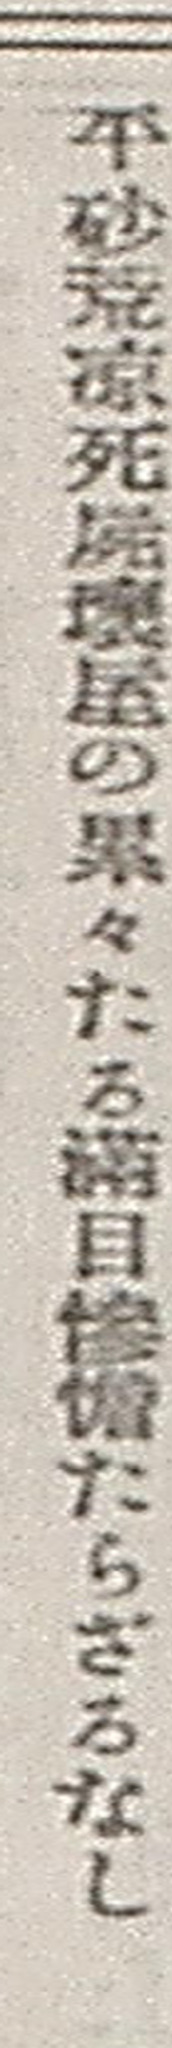平砂荒涼死屍壊屋の累々たる満目惨憺たらざるなし
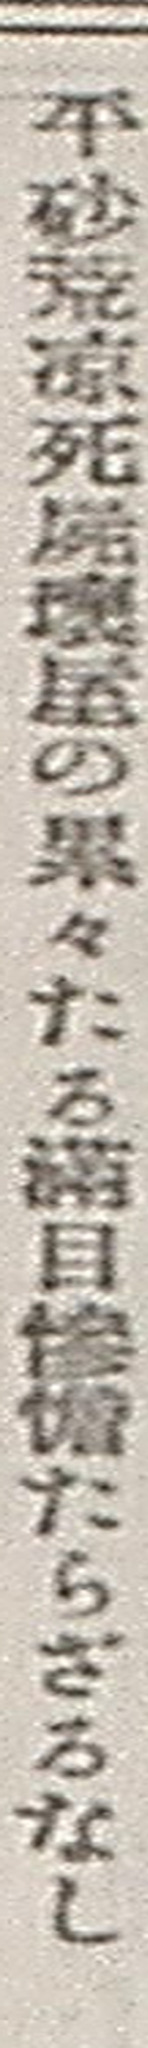平砂荒涼死屍壊屋の累々たる満目惨憺たらざるなし
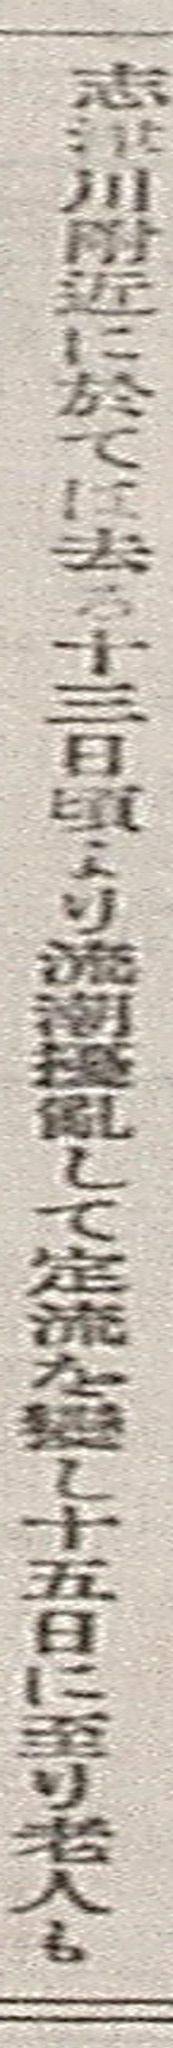志津川付近に於ては去る十三日頃より流潮擾乱して定流を変し十五日に至り老人も
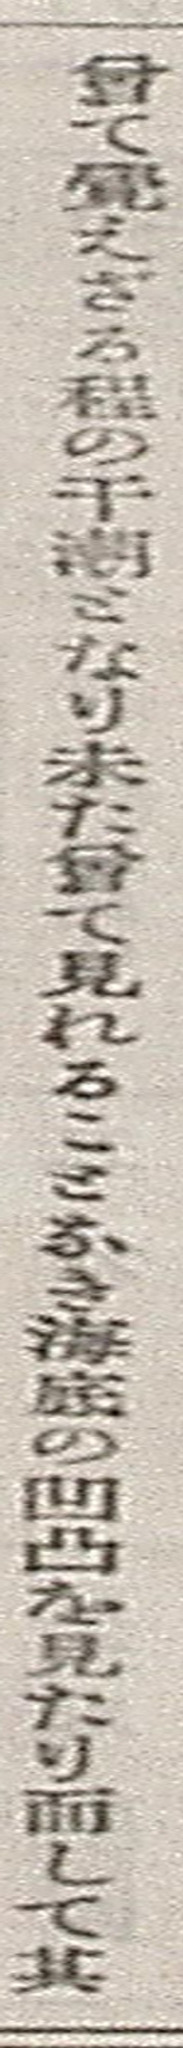曾て覚えざる程の干潮となり未た曾て見れることなき海底の凹凸を見たり而して其
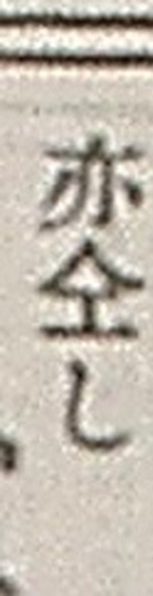亦仝し
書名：風俗畫報臨時増刊第百十九號　大海嘯被害録（中）
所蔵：東京大学地震研究所図書室 Earthquake Research Institute Library, The University of Tokyo, JAPAN
